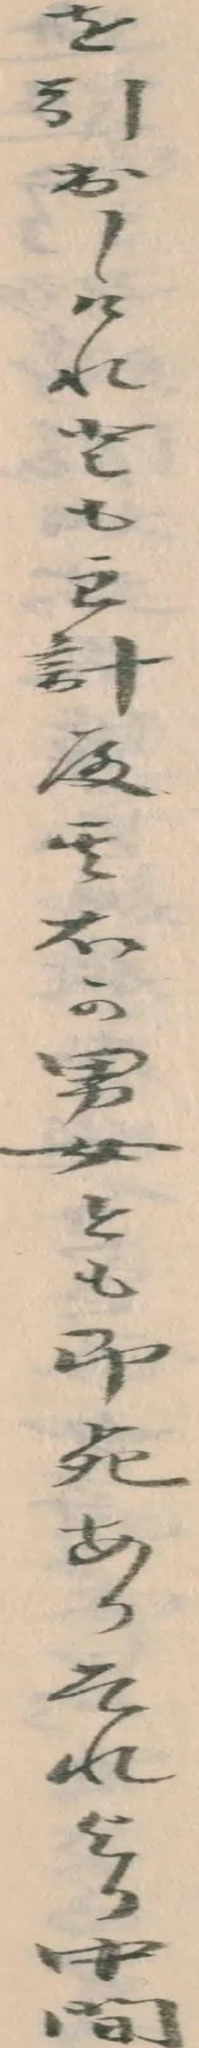を引出しけれとも主計殿其ほか男女とも即死ありそれより中間
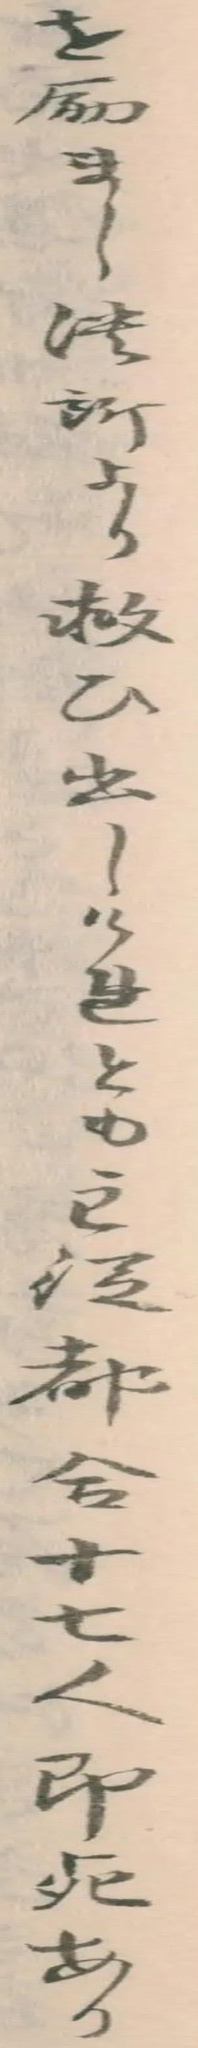を励まし潰所より救ひ出しけれとも主従都合十七人即死あり
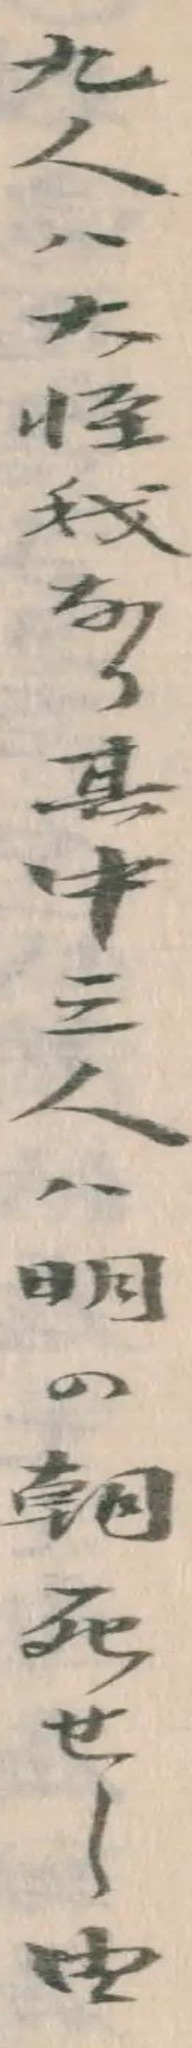九人は大怪我なり其中三人は明の朝死せし由
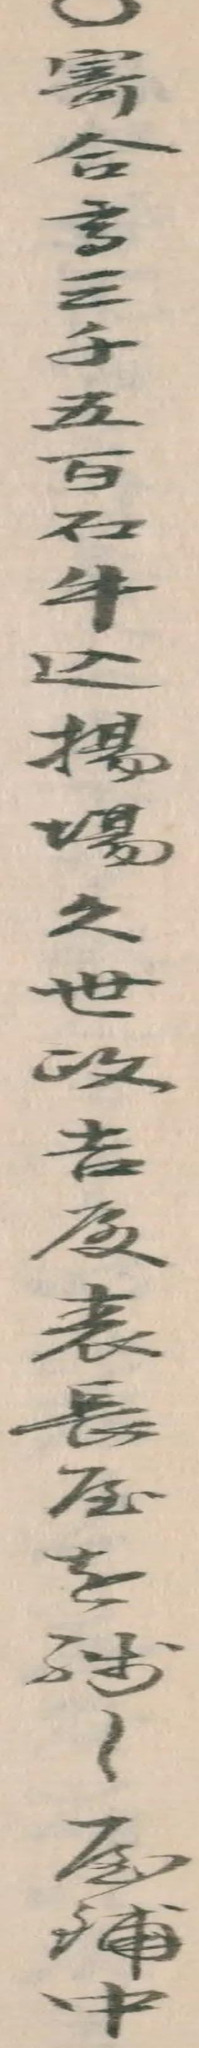〇寄合高三千五百石牛込揚場久世政吉殿表長屋を残し屋鋪中
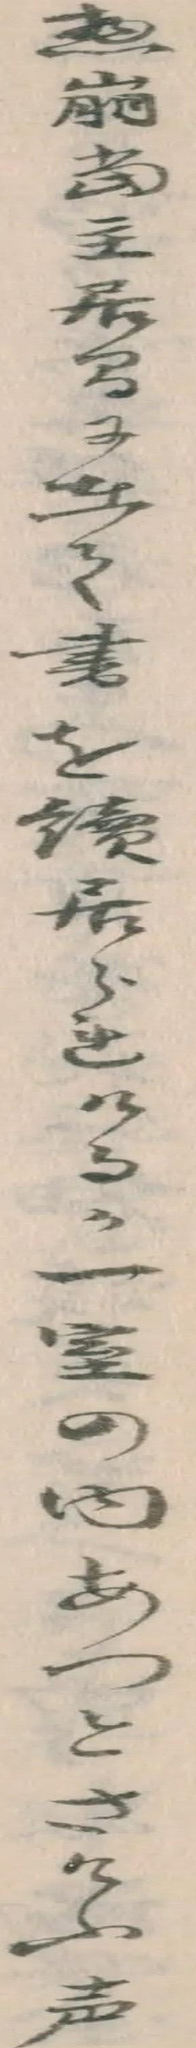惣崩当主居間に在て書を続居られけるか一室の内あつとさけふ声
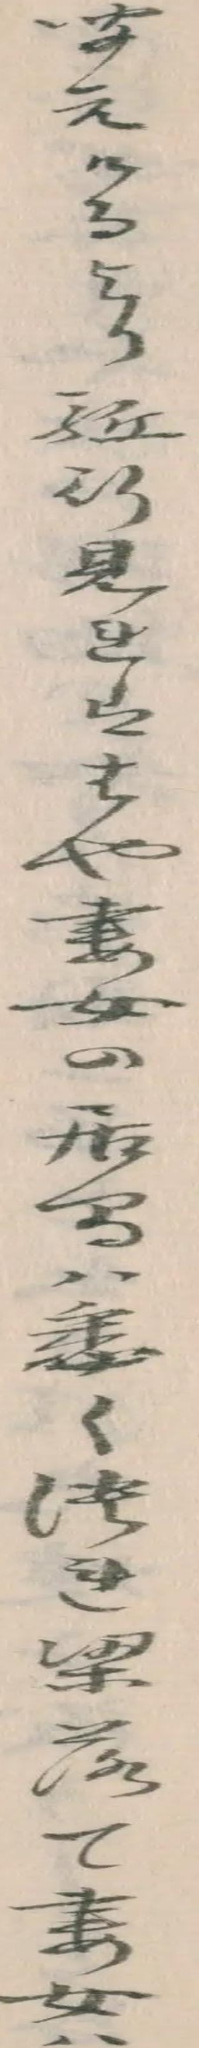聞えけるより駈行見れははや妻女の居間は悉く潰れ梁落て妻女は
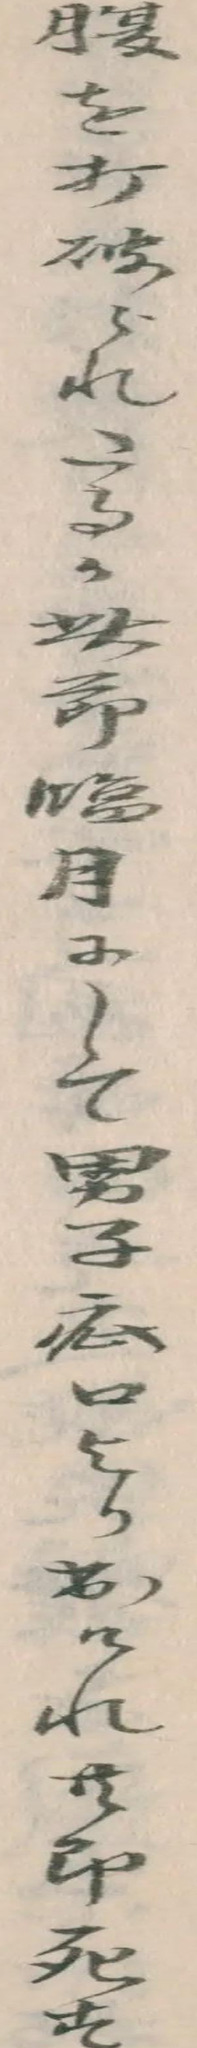腹を打破られたるか此節臨月にして男子疵口より出けれ共即死す
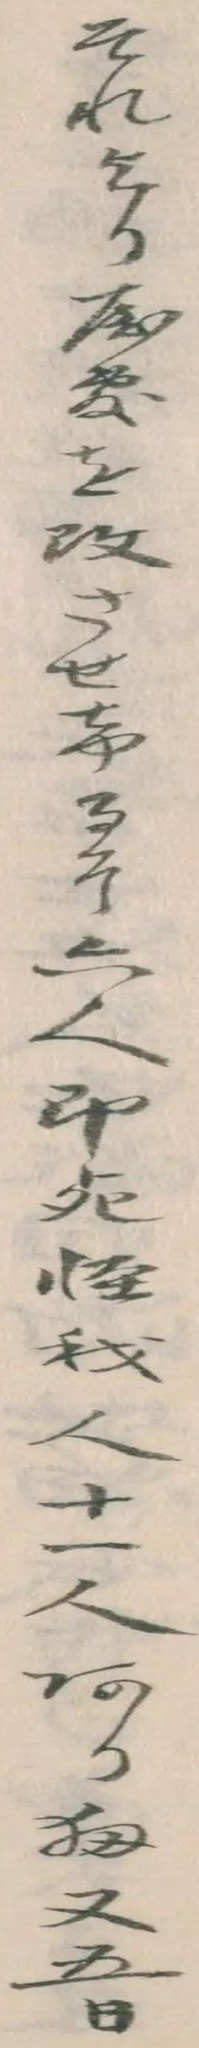それより屋敷を改させけるに六人即死怪我人十一人あり扨又五日
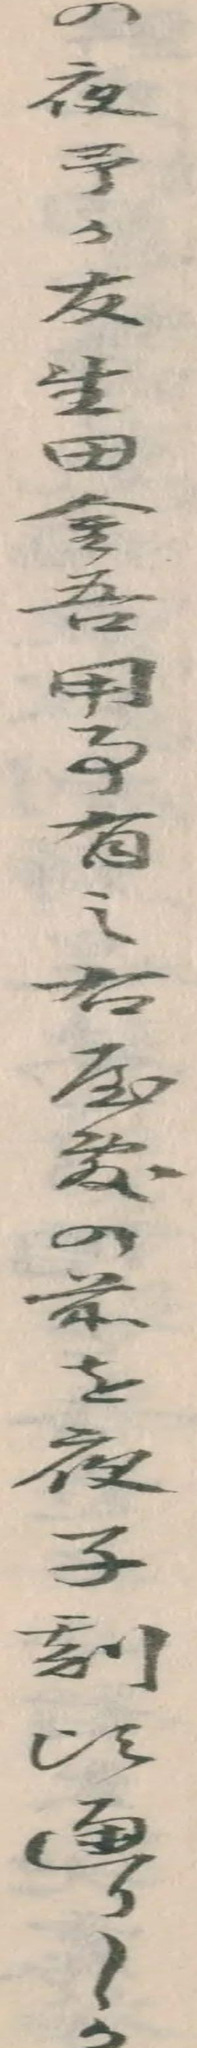の夜予か友生田金吾用事有之右屋敷の前を夜子刻頃通りしか
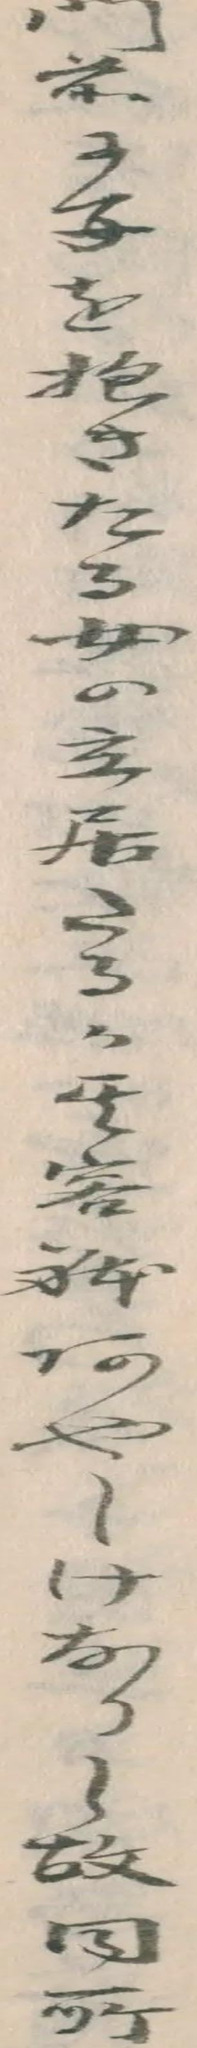門前に子を抱きたる女の立居たるか其容躰あやしけなりし故同所
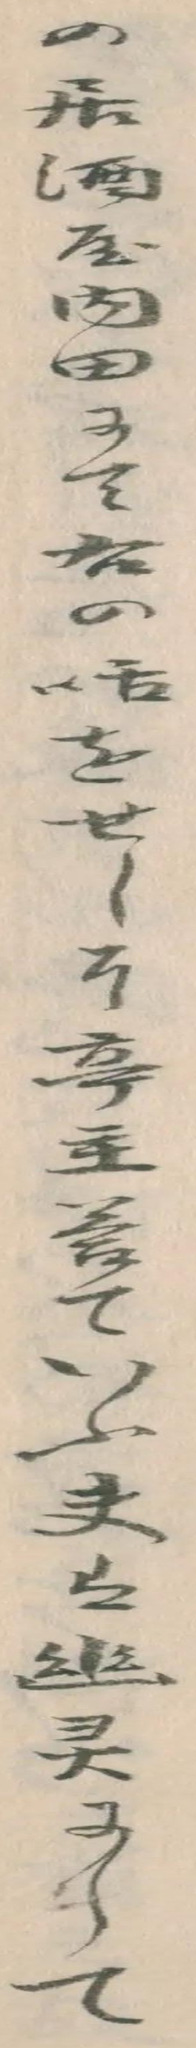の居酒屋内田にて右の話をせしに亭主答ていふ夫は幽霊にして

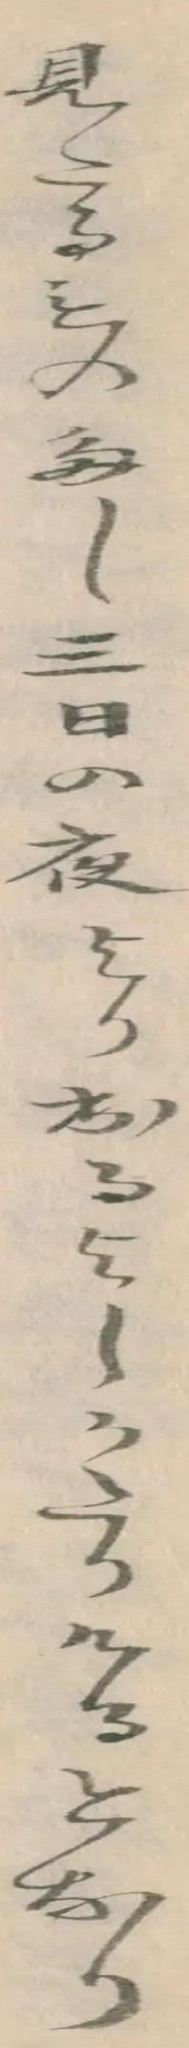見たるもの多し三日の夜より出るよしかたりけるとなり
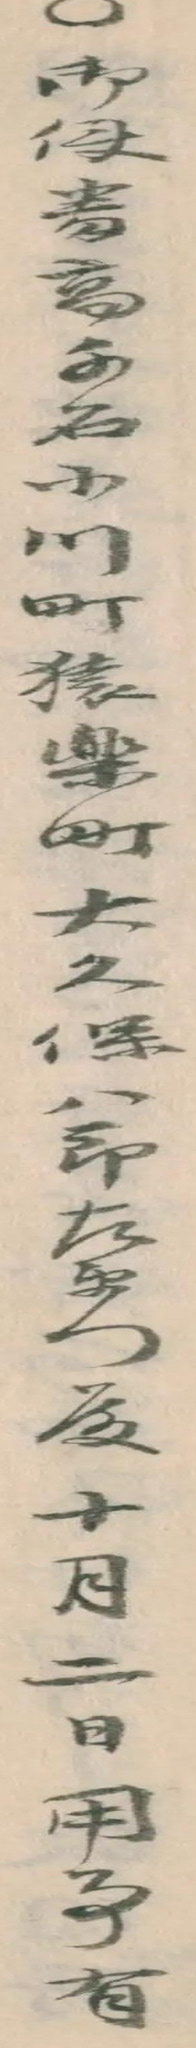〇御使番高千石小川町猿楽町大久保八郎左衛門殿十月二日用事有
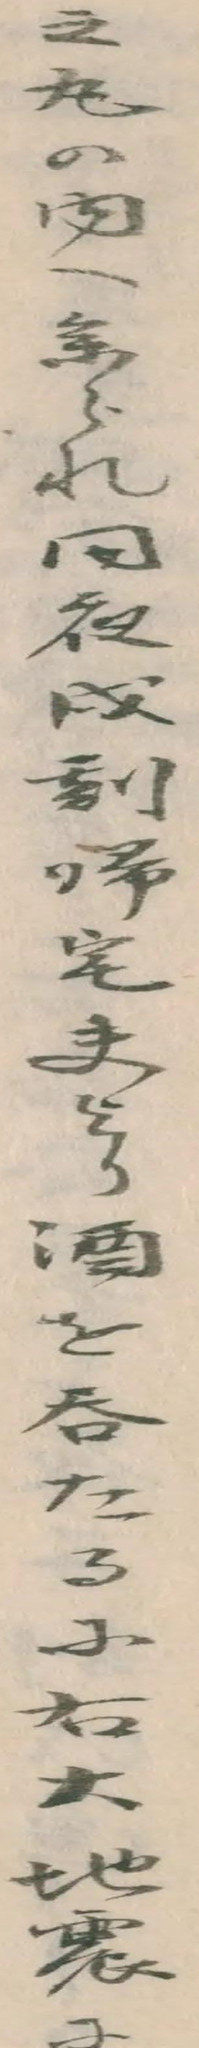之丸の内へ参られ同夜戌刻帰宅夫より酒を呑たるに右大地震に
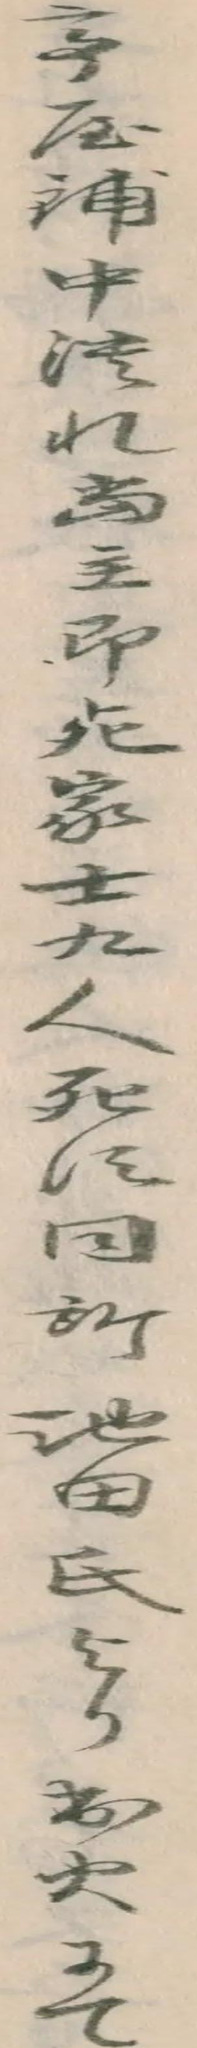て屋鋪中崩れ当主即死家士九人死す同所池田氏より出火にて
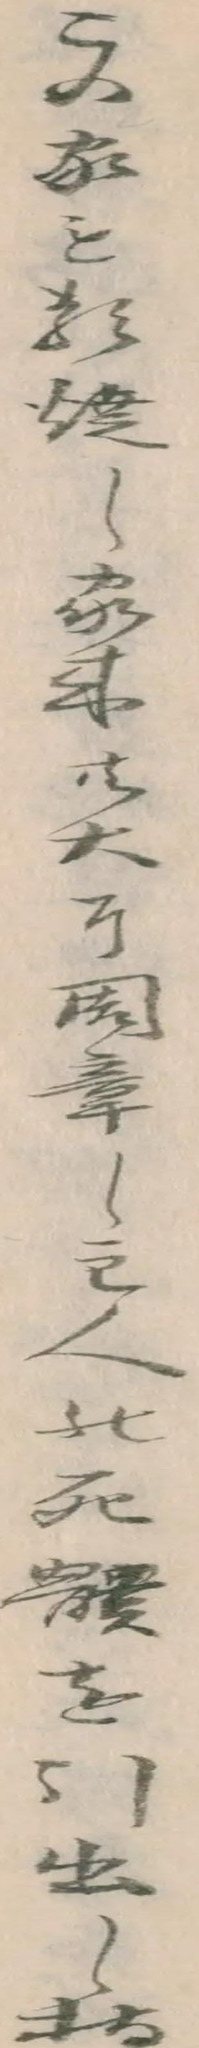この家も類焼し家来共大に周章し主人の死骸を引出し持
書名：地災撮要. 巻10(地震之部) 上,下
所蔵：国立国会図書館 National Diet Library, JAPAN
